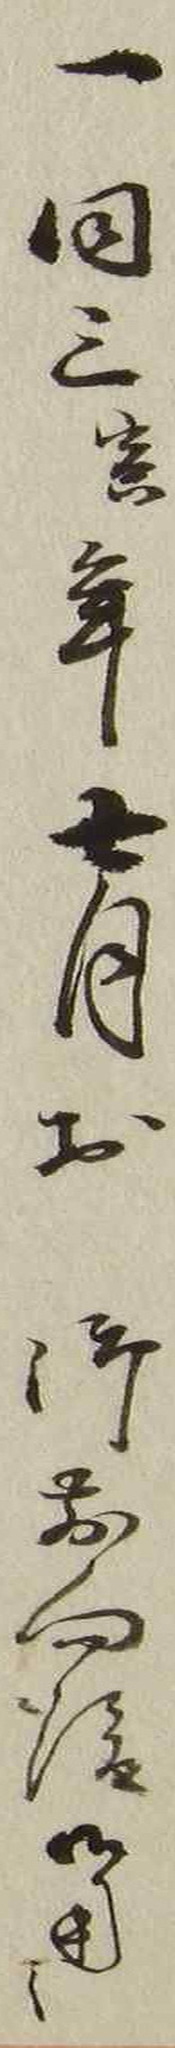一同三寅年七月於御前向後御用之
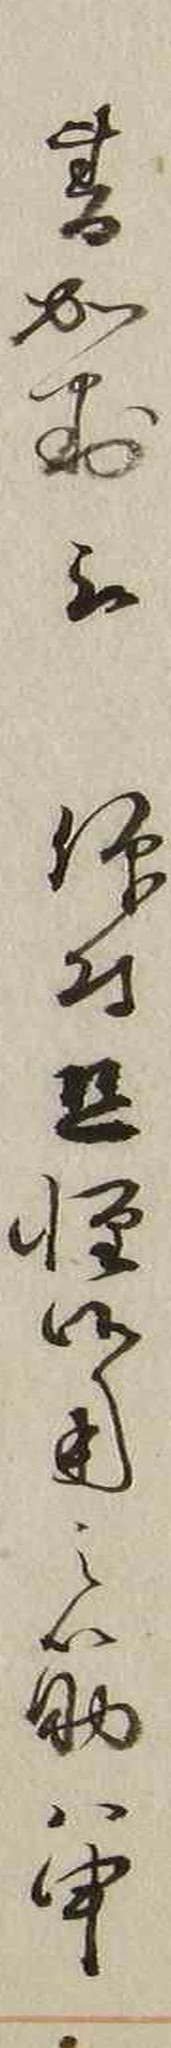書加判被仰付旦軽御用之筋は申
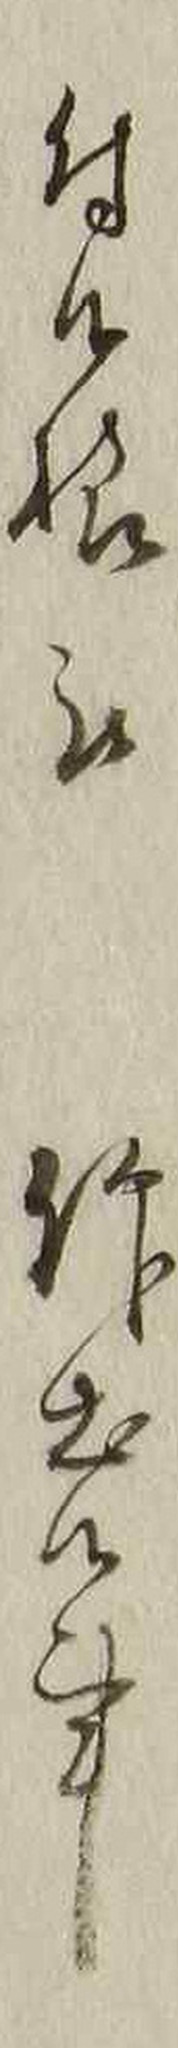付候様被仰出候事
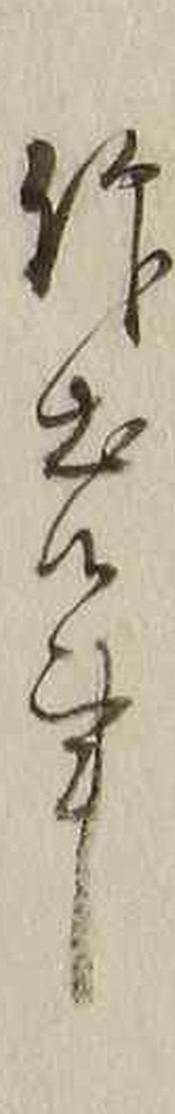仰出候事
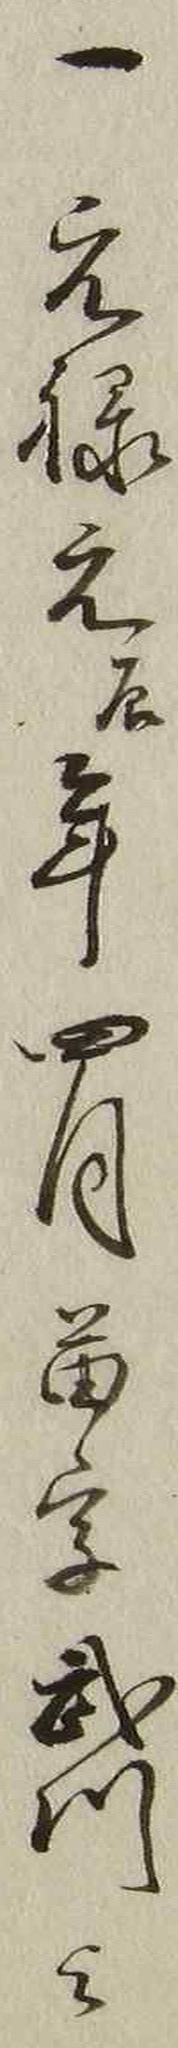一元禄元辰年四月苗字武川と
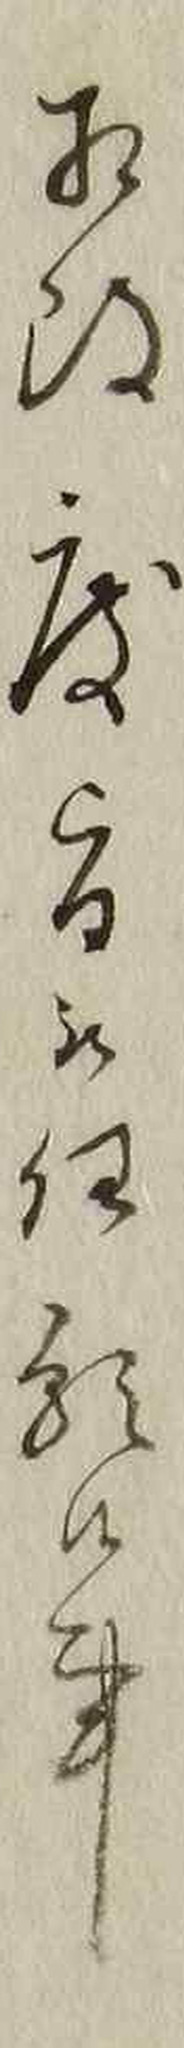相改度度旨任願候事
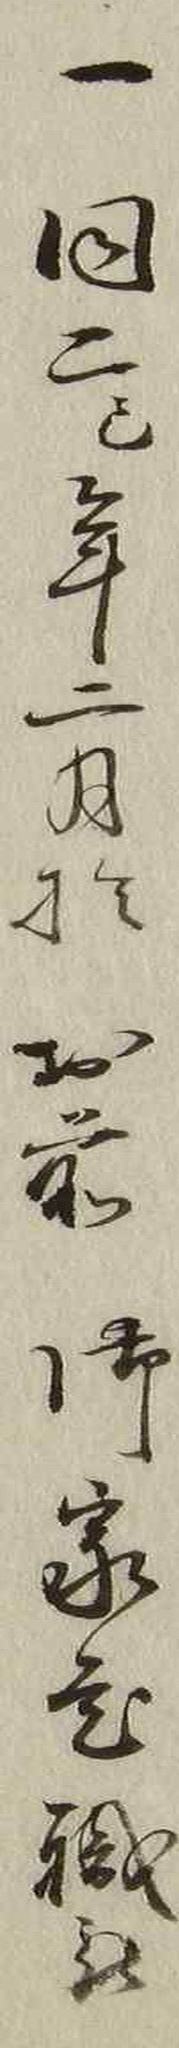一同二巳年二月於御前御家老職被
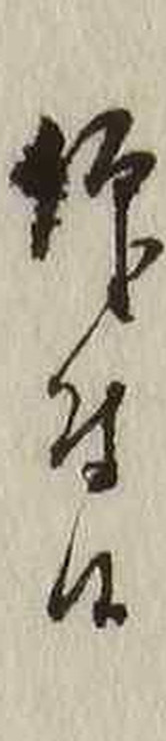仰付候
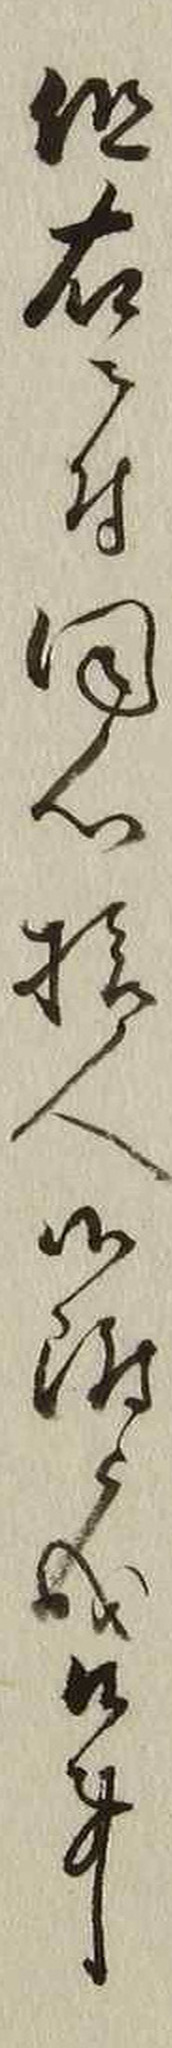但右に付同心拾人御附被候事
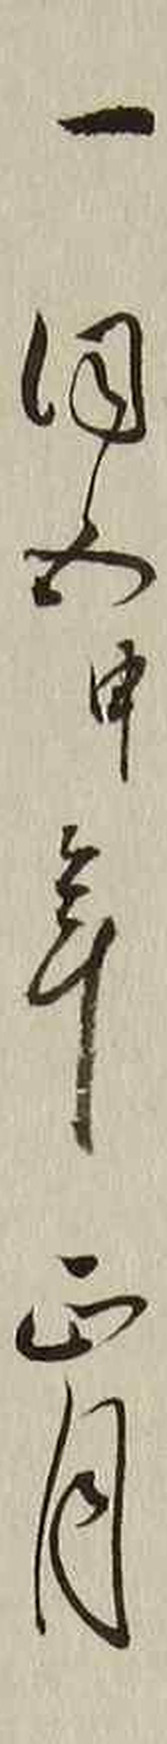一同五申年正月
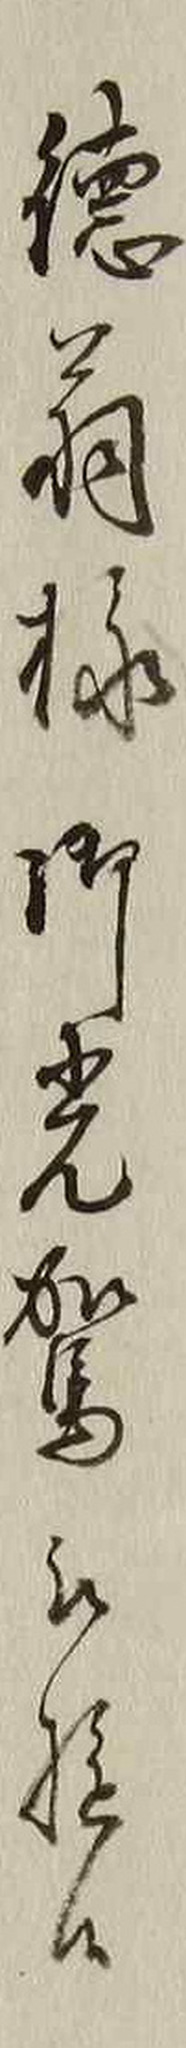徳翁様御光駕被遊候
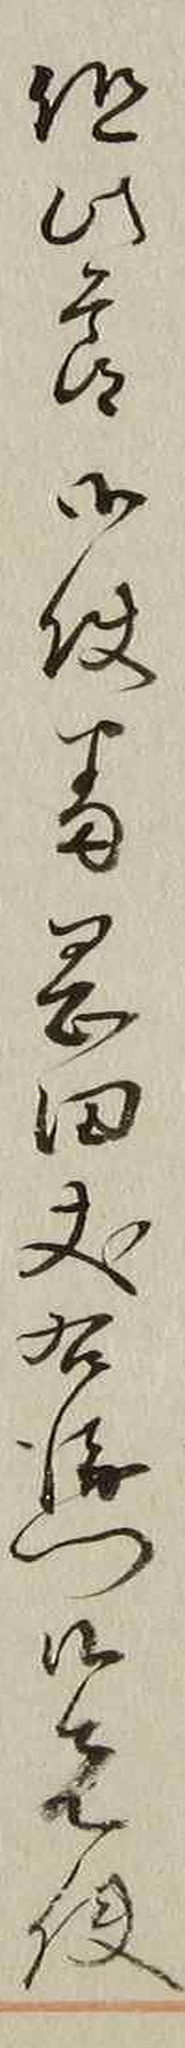但此節御使番岡田丈右衛門御先使
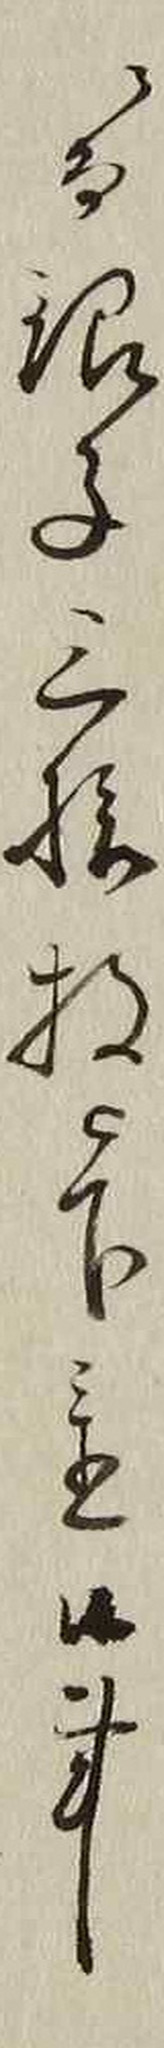に而銀子三拾枚被下置候事
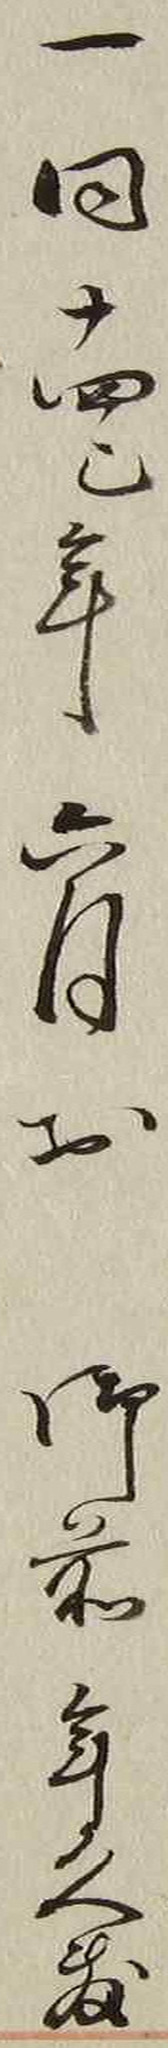一同十四巳年六月於御前年久敷
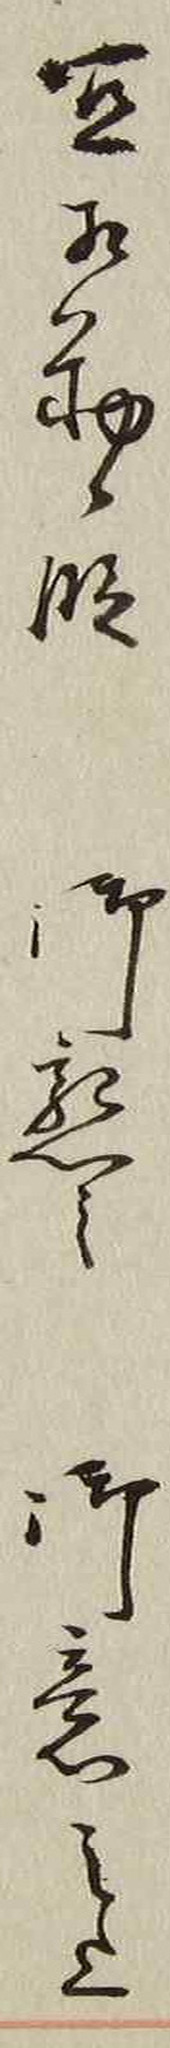宜相勤候段御懇之御意之上
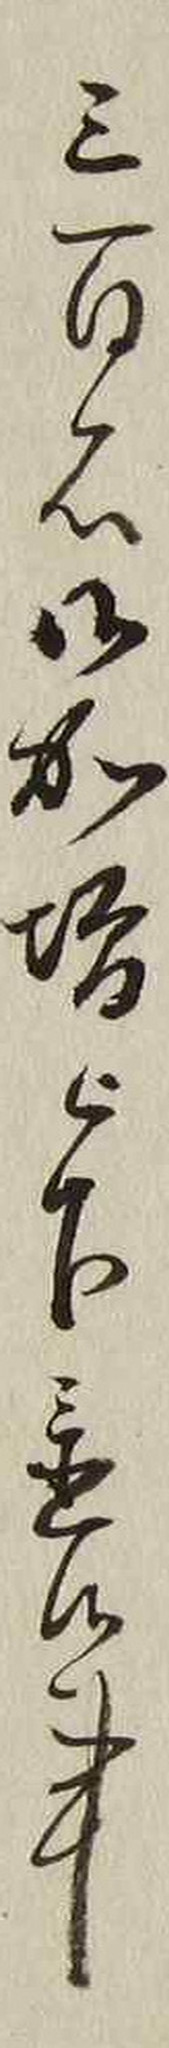三百石御加増被下置候事
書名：諸士系譜　巻之159　な之部1
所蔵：会津若松市立会津図書館
